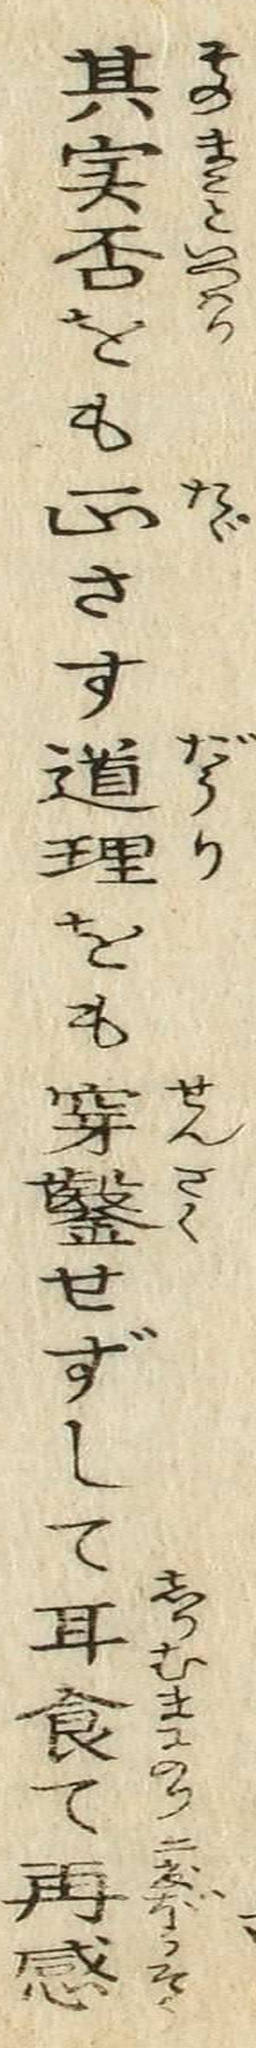其実否をも正さす道理をも穿鑿せずして耳食て再感
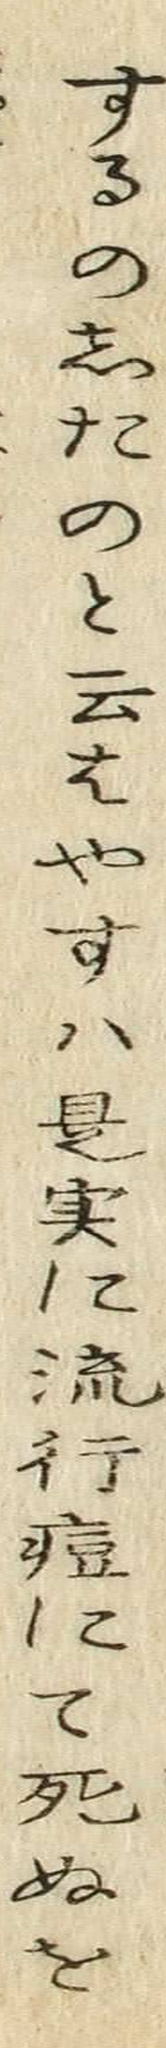するのしたのと伝はやすハ是実に流行痘にて死ぬ
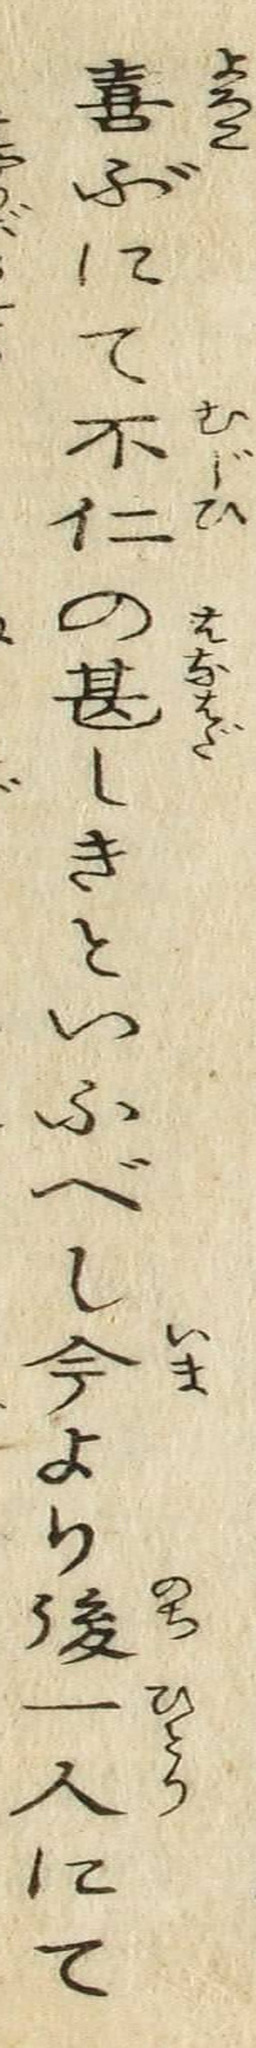喜ぶにて不仁の甚しきといふべし今より後一人にて
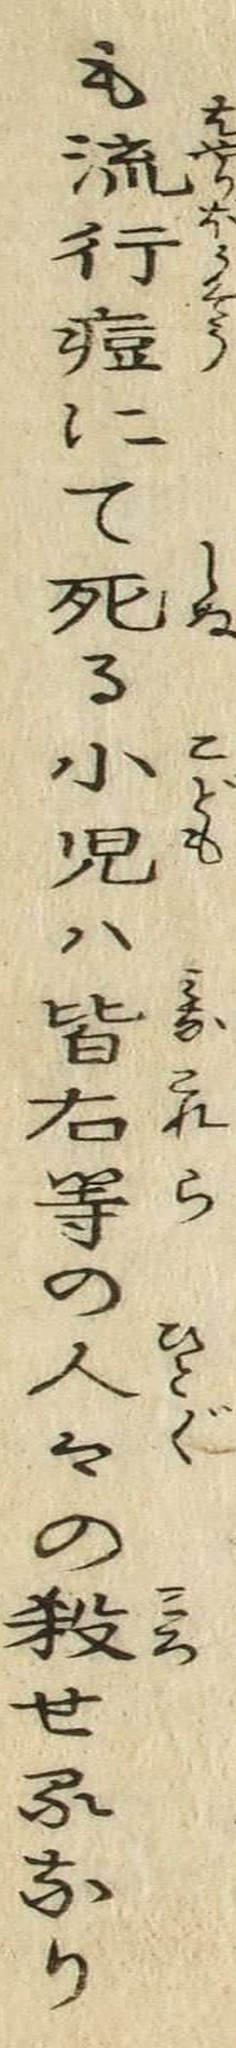も流行痘にて死る小児ハ皆右等の人々の殺せるなり

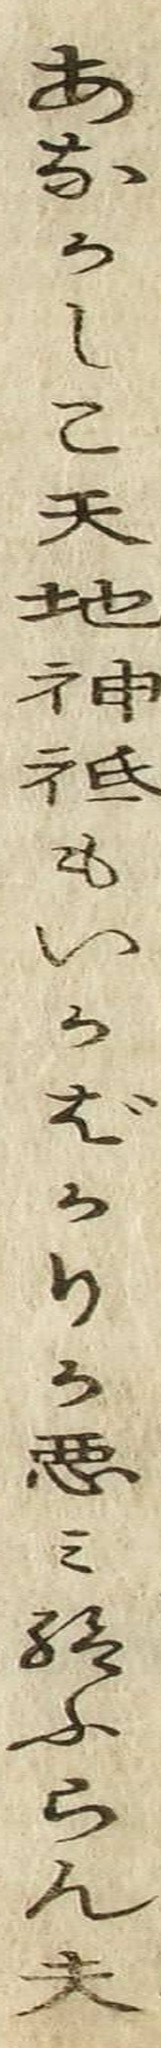あなかしこ天地神袛もいかばかりか悪み給ふらん夫
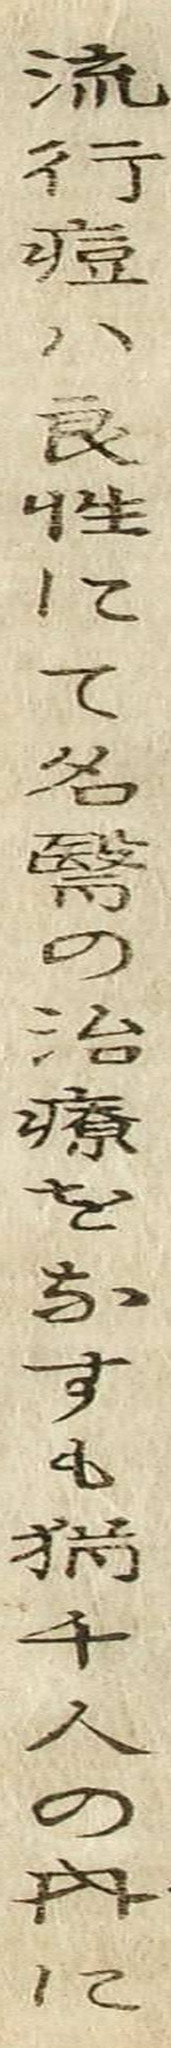流行痘ハ良性にて名醫をなすも猶千人の内に
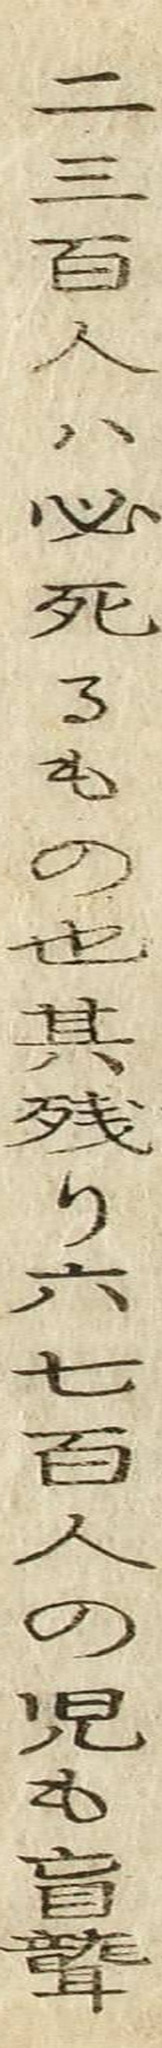二三百人ハ必死るもの也其残り六七百人の児も盲聾
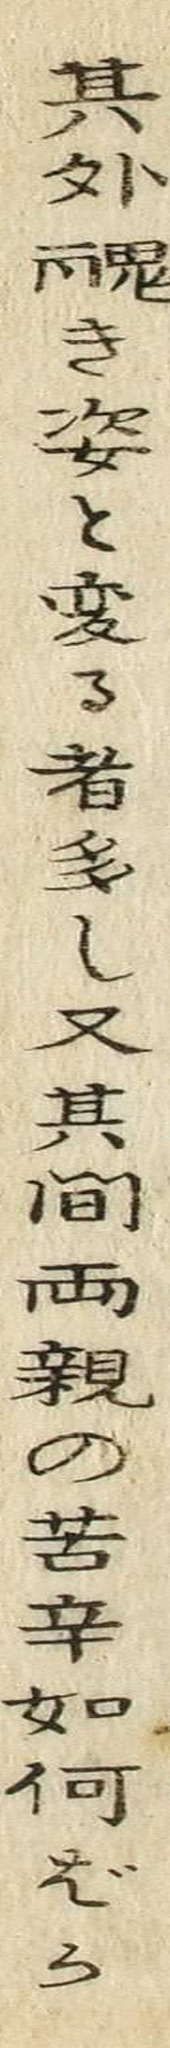其他醜き姿と変る者多又其間両親の苦辛ばか
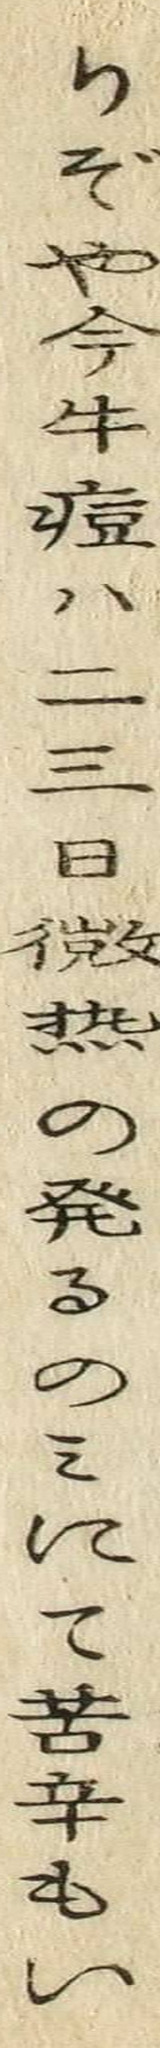りぞや今牛痘ハ二三日微熱の発るのみにて苦辛もい
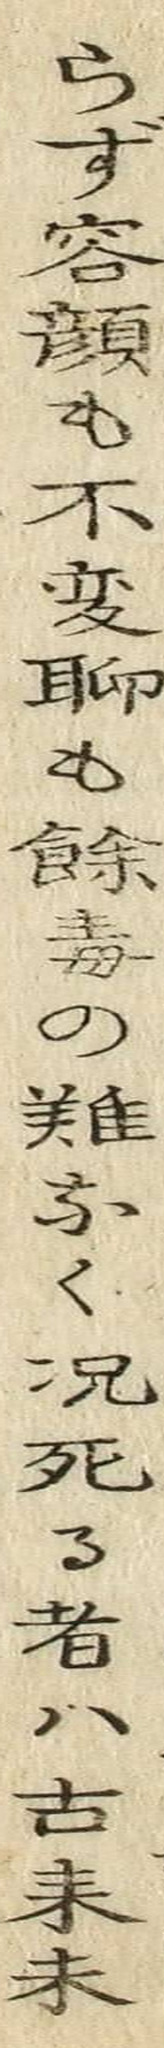らず容顔も不変聊も餘毒の難なく況死る者ハ古来未（いまだ
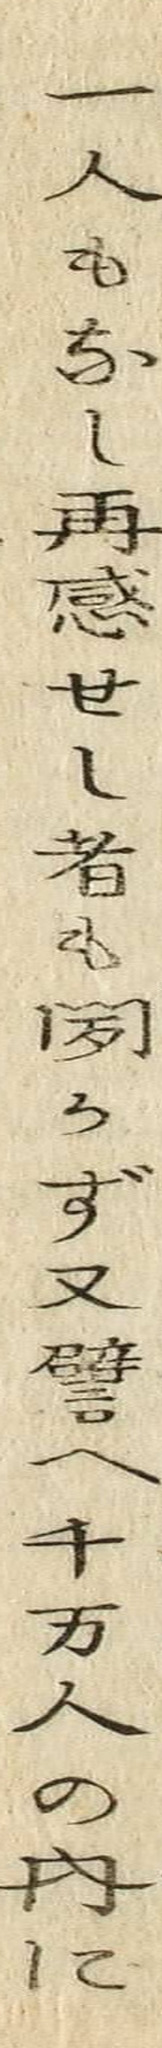一人もなし再感せし者も聞か又譬へ千万人の内
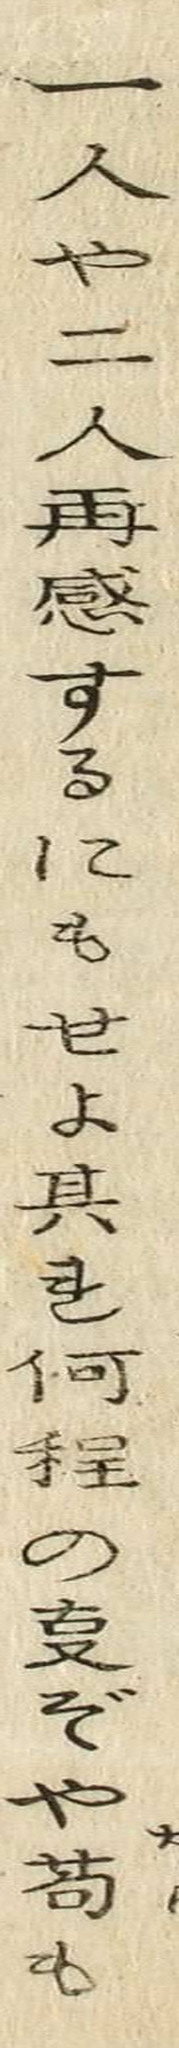一人や二人再感するにもせよ其れ何程の㕝ぞや苟も
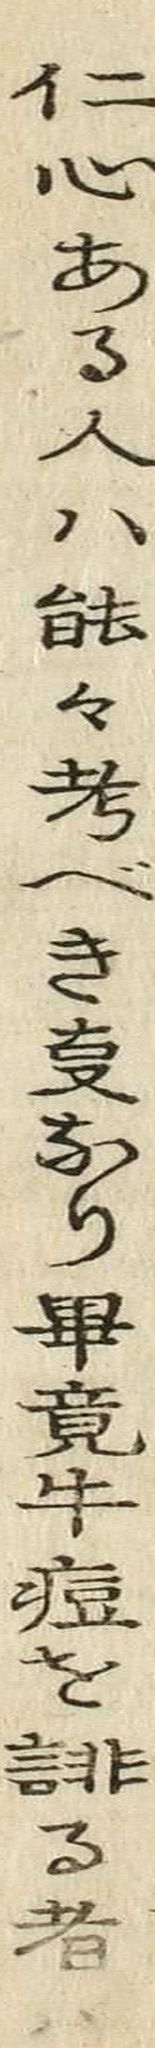仁心ある人ハ能々考べき㕝なり畢竟牛痘を誹る者ハ
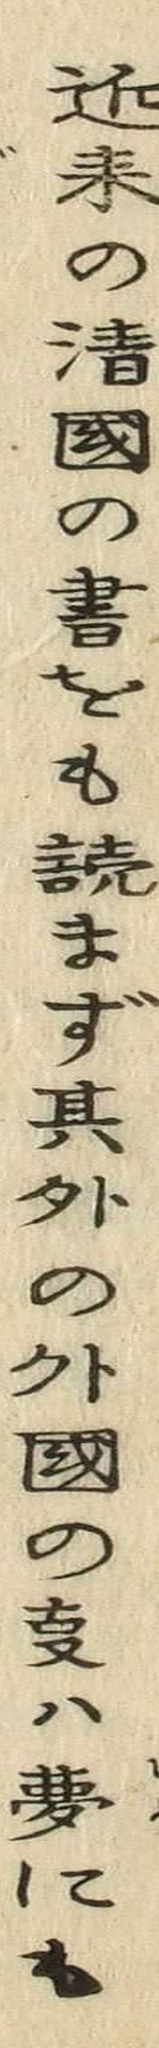近来の清國書をも読まず其他の外國の㕝ハ夢にも
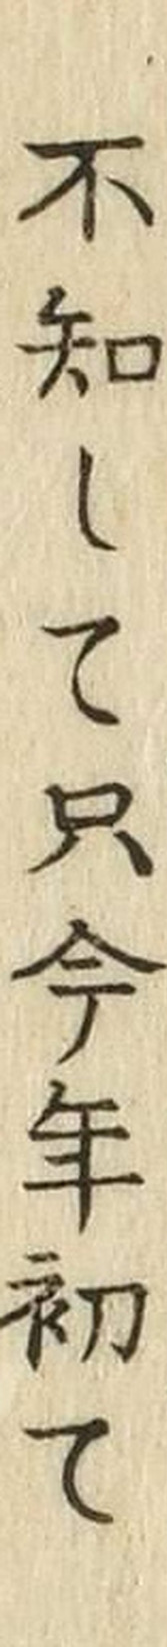不知して只今年初て
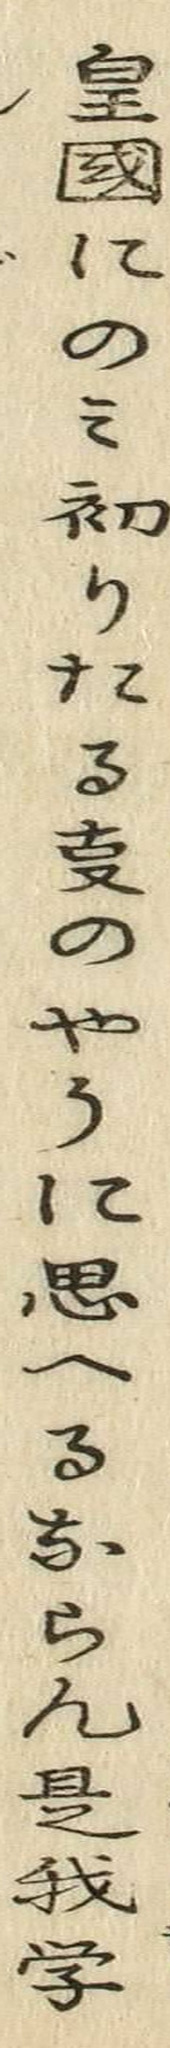皇國にのみ初りたる㕝のやうに思へるならん是我学
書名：牛痘問答
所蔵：九州大学医学図書館 国文学研究資料館
